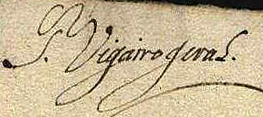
S.or Vigairo geral.
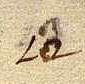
12
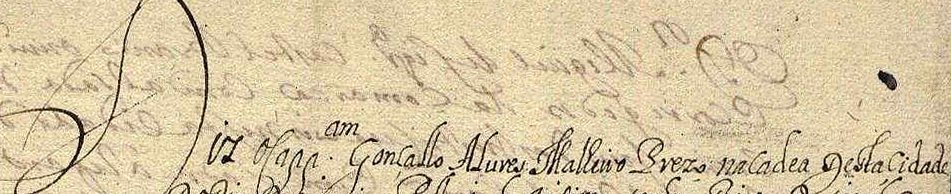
Diz o Capp.am Gonçallo Alures Malheiro Prezo na Cadea Desta cidade
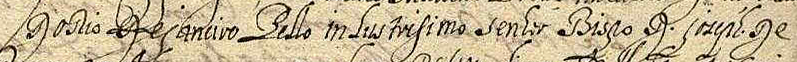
Do Rio De janeiro Pello inlustrisimo senhor Bispo D. jozeph. De
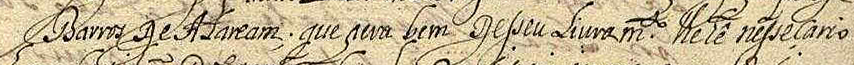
Barros de Alarcam; que pera bem De sseu Liuram.to lhe hê nesseçario
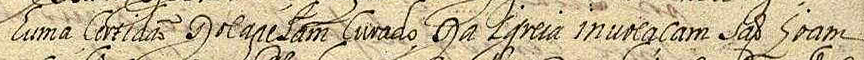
huma Certidão Do Capelam Curado, Da Igreia inuocaçam Saõ Joam
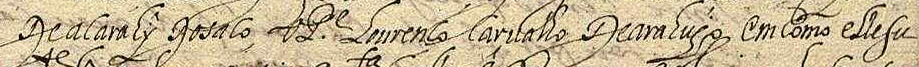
De aCarahy Do saco, o P.e Lourenço Carualho De arahujo em como elle su
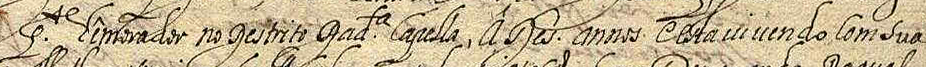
p.te he morador no Destrito da d̄.a Capella, a Des annos e esta uiuendo com sua
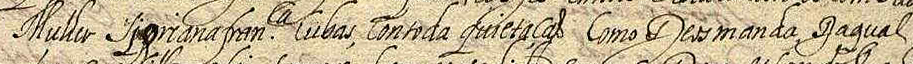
Mulher Sipriana fran.ca Cubas, con toda quietação Como Deos manda Da qual
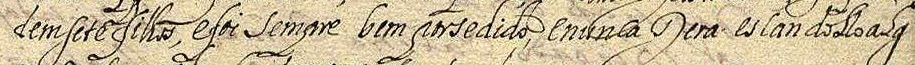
tem sete filhos, e foi sempre bem porsedido, e nunca Dera escandollo alg
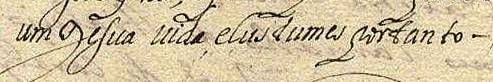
um De sua uida, e Custumes portanto -
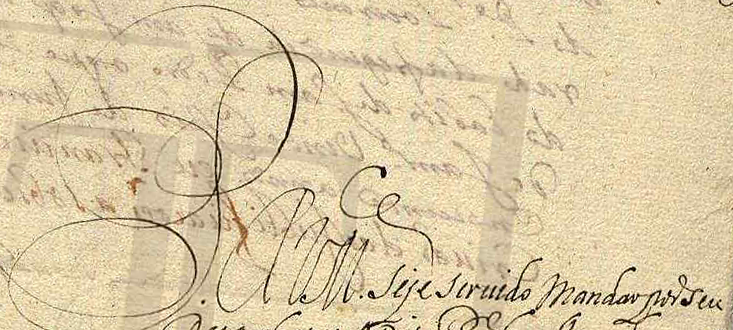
P A V M.ce seja seruido mandar por seu
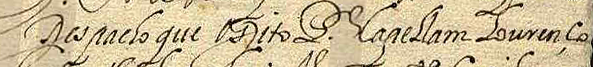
Despacho que o Dito P.e Capellam Lourenço
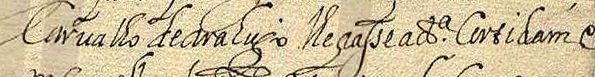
Carualho de arahujo lhe passe a d̄.a Certidam e
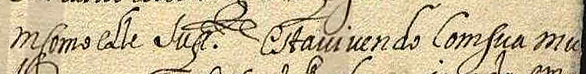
m Como elle Sup.te Esta uiuendo Com sua mu
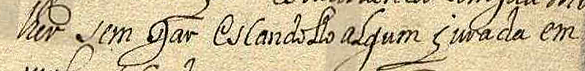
lher sem Dar escandollo algum jurada em
